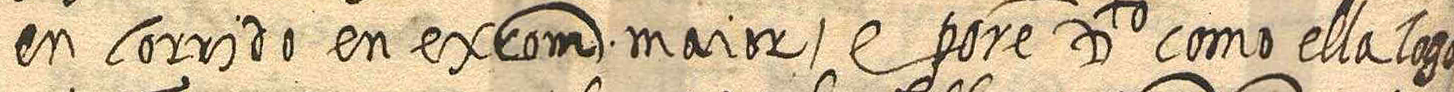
encorrido en exc̄om maior / e porē vto como ella logo
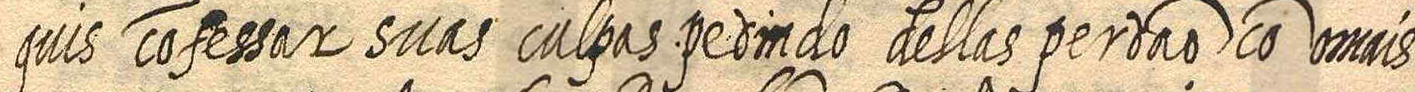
quis cōfessar suas culpas pedindo dellas perdão cō o mais
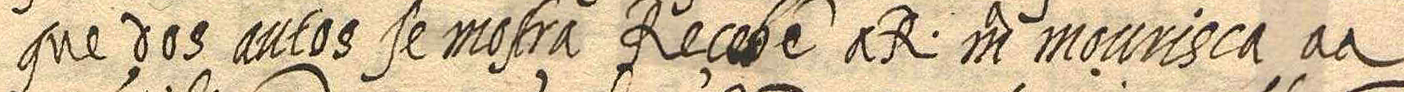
que dos autos se mostra Recebē a R. ma mourisca aa
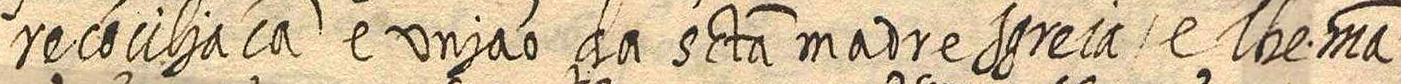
reconciljaçā e vnjão da sctā madre Jgreia / e lhe mā
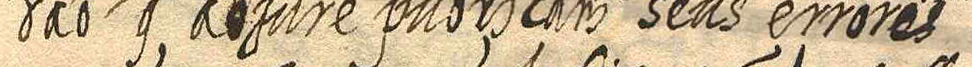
dão q̄ abjure pubricamte seus errores
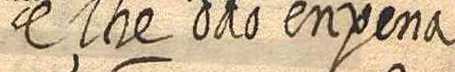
e lhe dão en pena
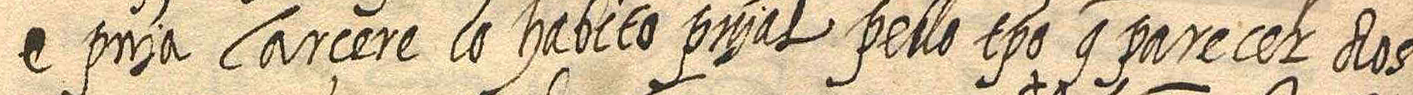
e pnj̄a Carcere cō habito pnj̄al pello tp̄o q̄ parecer Aos
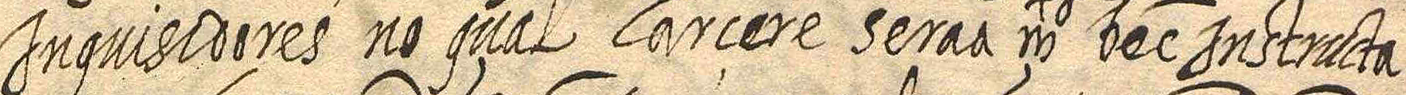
Jnquisidores no quaL Carcere seraa mto bēe Jnstructa
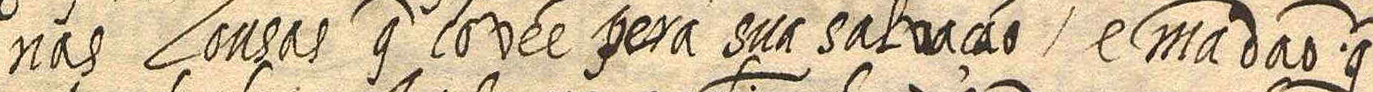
nas Cousas q̄ cōvēe pera sua salvação / e mādão q̄
